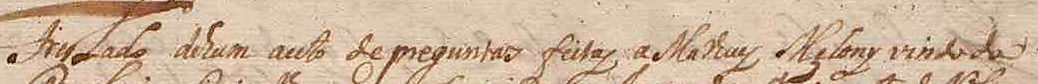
TresLado de hum auto de preguntas feitas a Matheus Melony vindo da
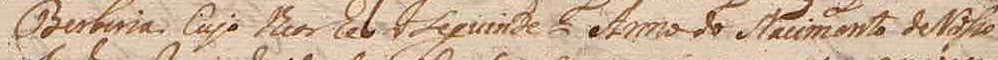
Berberia Cujo theor he o seguinte = Anno do Nacimento de Nosso
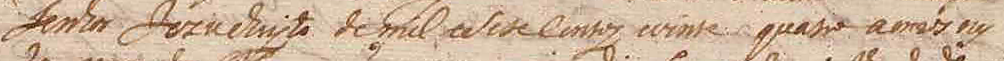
senhor Iezu christo de mil e setecentos e vinte quatro annos nes
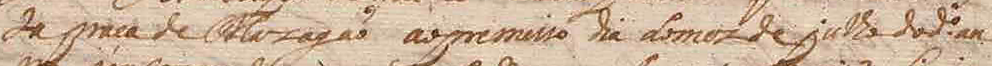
ta praça de Mazagaõ ao primeiro dia do mez de julho do d.o an
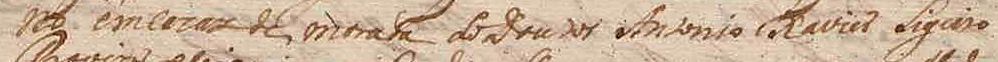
no em cazaz de morada do Doutor Antonio Xavier Ligeiro
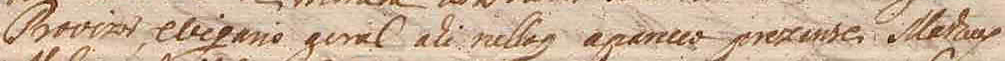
Provizor, e vigario geral ahi nellas apareceo prezente Matheus
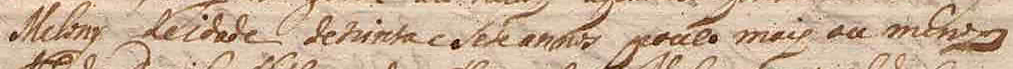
Melony de idade de trinta e sete annos pouco mais ou menos
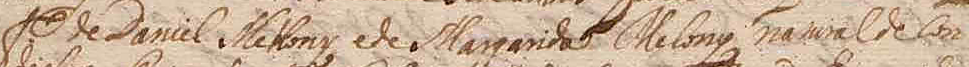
f.o de Daniel Mellony e de Margarida Melony natural de Con
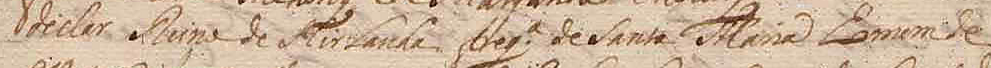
diclar Reino de Hirlanda freg.a de Santa Maria homem de
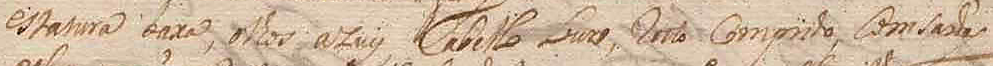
estatura baxa, olhos azuis, Cabello Louro, Rosto Comprido, Com sarda
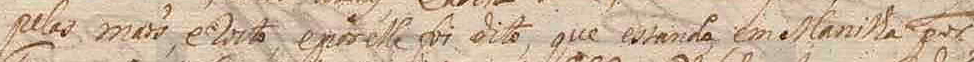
pelas maõs, e Rosto, e por elle foi dito, que estando em Manilha por
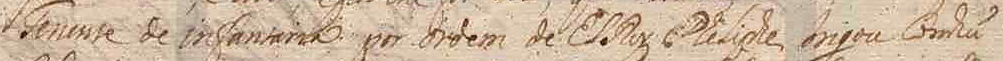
Tenente de infantaria por ordem de El Rey Pheliphe brigou Com hū
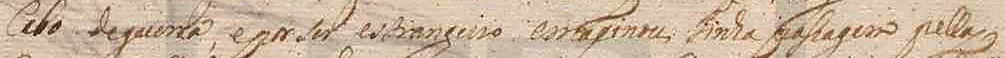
Cabo de guerra, e por ser estrangeiro emaginou tinha passagem pellas
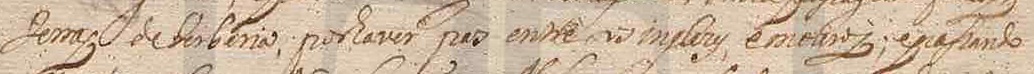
terras de berberia, por haver pas entre os inglezes, e mouros; e passando
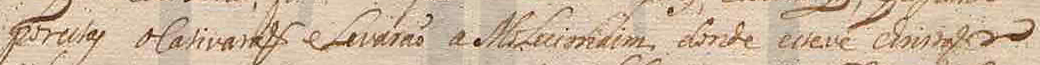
por ellas o Cativaraõ e Levaraõ a MoLuimdim donde esteve christaõ
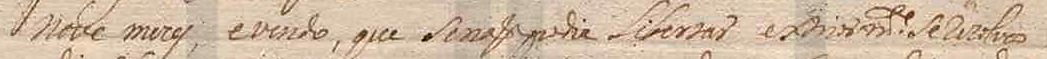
nove mezes, e vendo, que se naõ podia Libertar exteriom.te se Rezolveo
